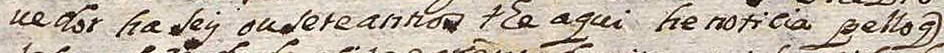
uedor ha seis ou sete annos the aqui he noticia pello q̄
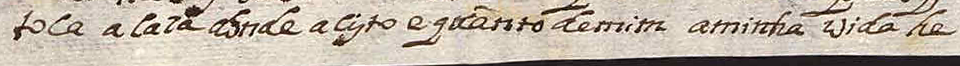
toca a caza donde acisto e quānto de mim a minha uida he
